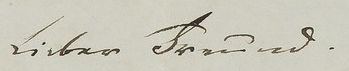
Lieber Freund.
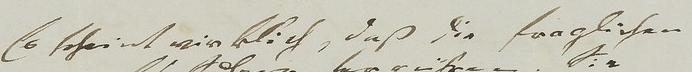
Es scheint wirklich, daß die fraglichen
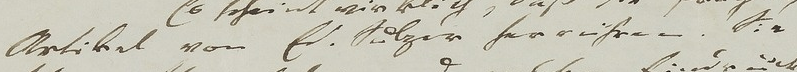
Artikel von Ed. Sulzer herrühren. Sie
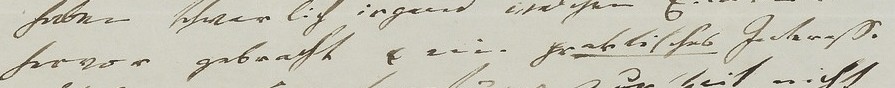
hervor gebracht & ein praktisches Interesse
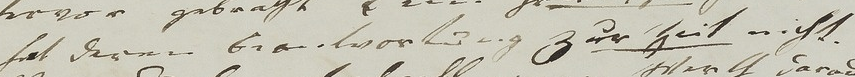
hat deren Beantwortung zur Zeit nicht.
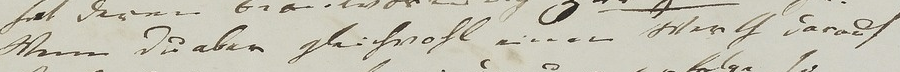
Wenn Du aber gleichwohl einen Werth darauf
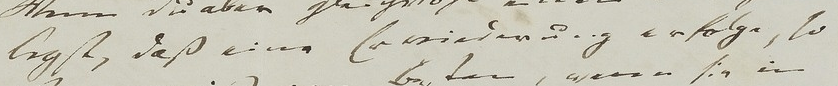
legst, daß eine Erwiederung erfolge, so
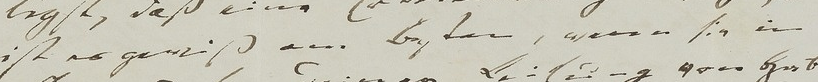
ist es gewiß am Besten, wenn sie in
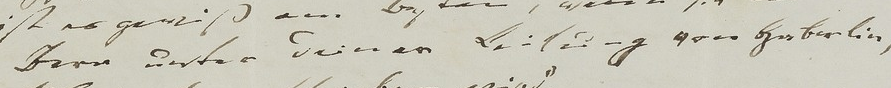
Bern unter Deiner Leitung von Häberlin,
